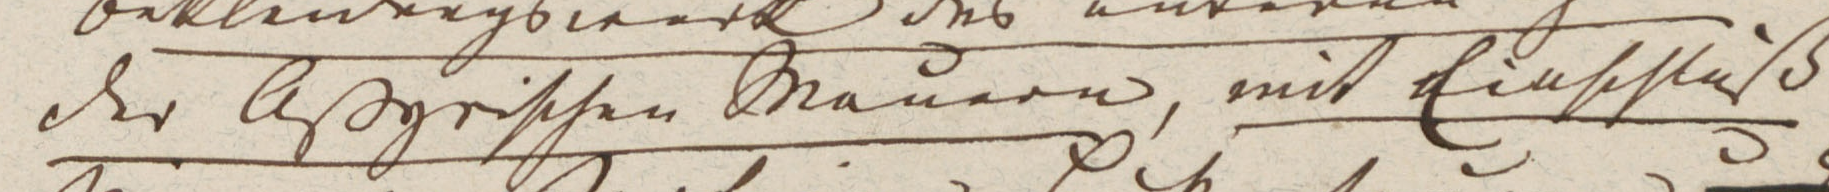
der Assyrischen Mauern, mit Einschluss
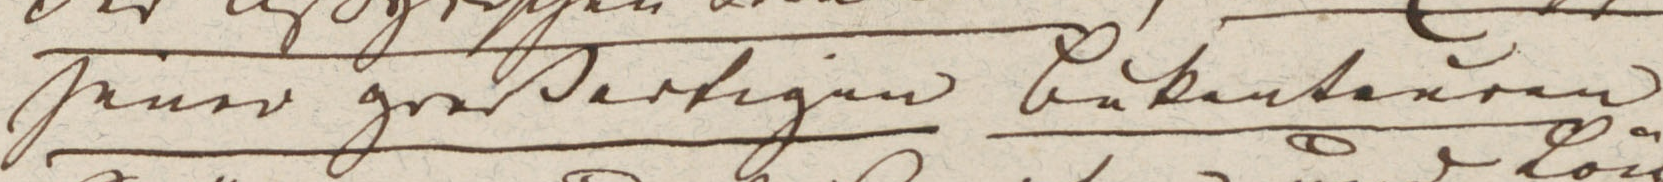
jener grossartigen Bukentauren
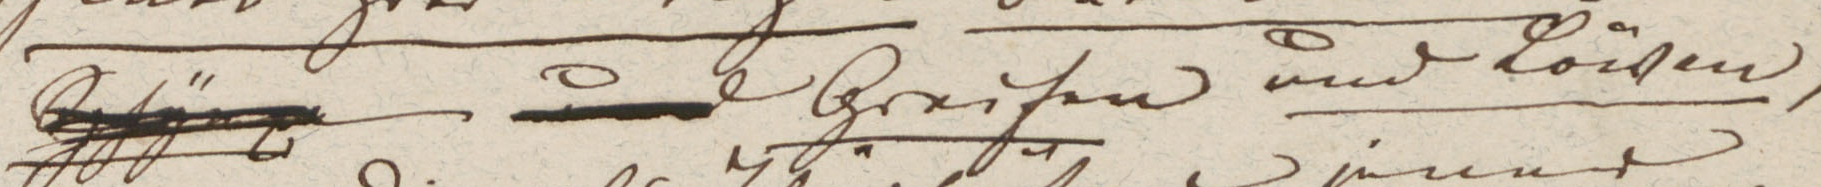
Sphinxe Sphynxe und Greifen und Löwen,
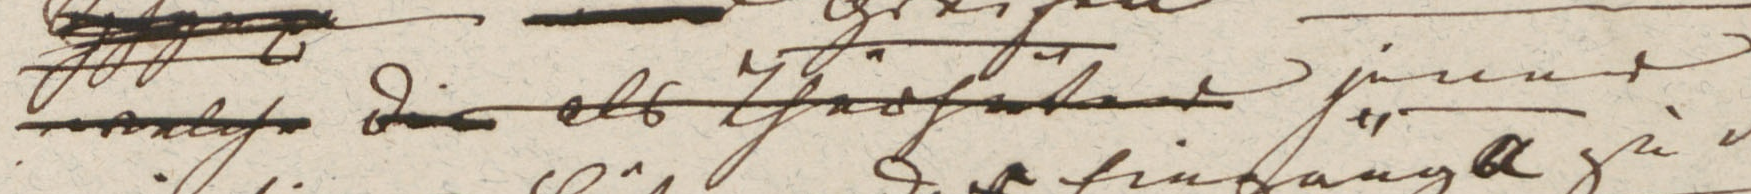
welche die als Thürhüter jener
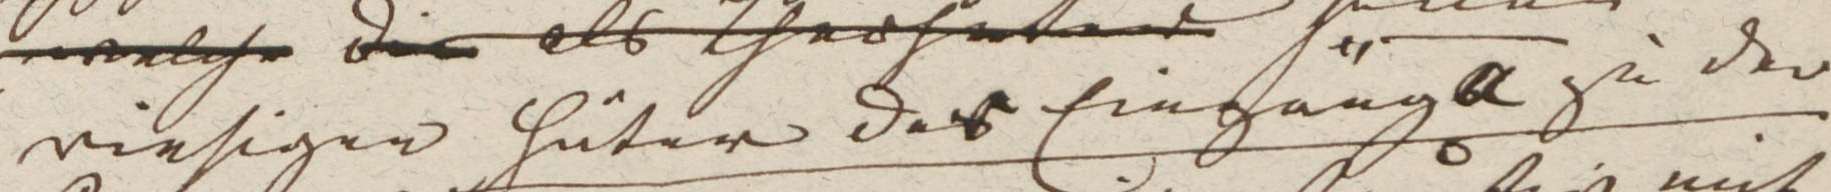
riesigen Hüter ders Eingäanges zu der
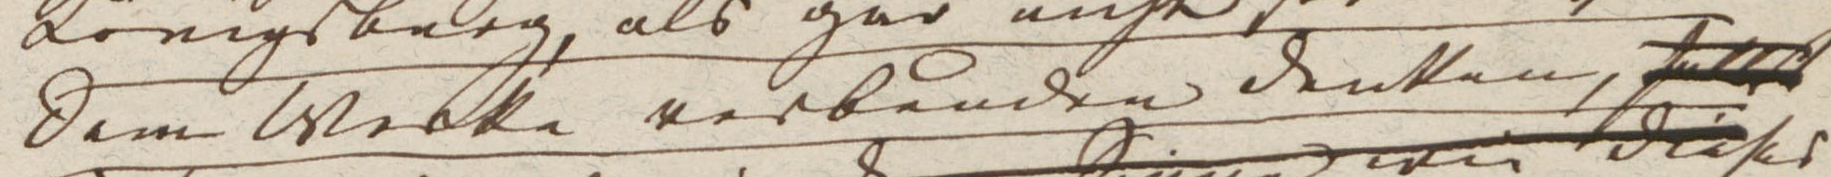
dem Werke verbunden denken, selbst
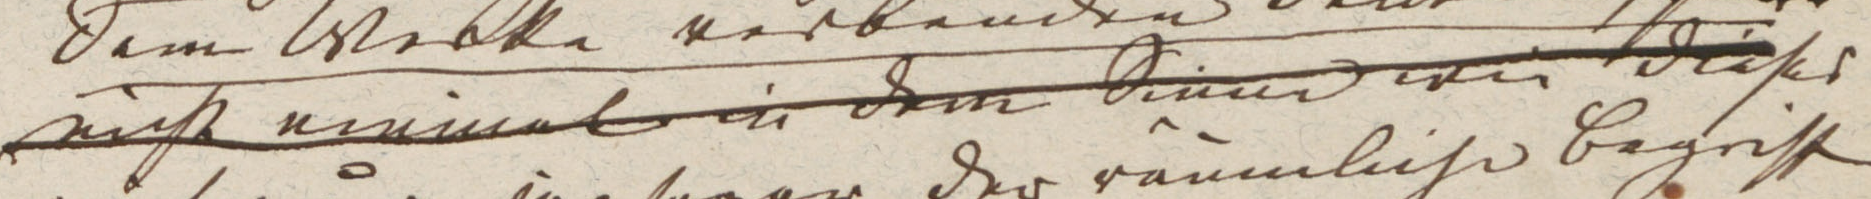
nicht einmal in dem Sinne wie dieses
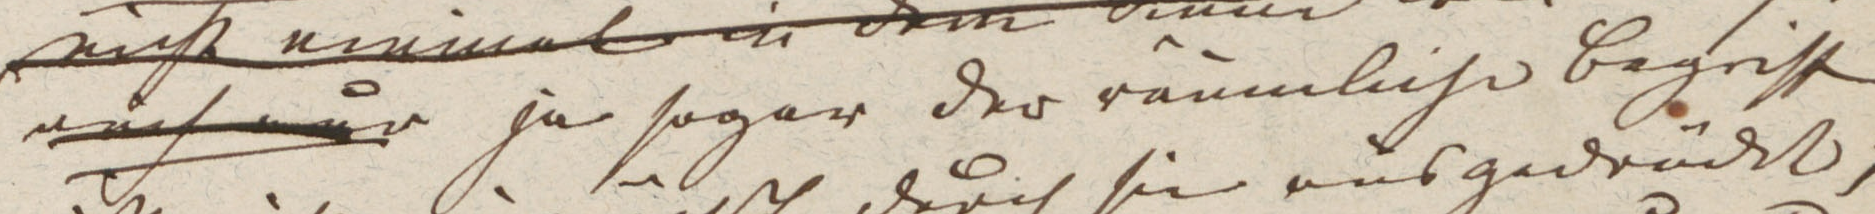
auch nur ja sogar der räumliche Begriff
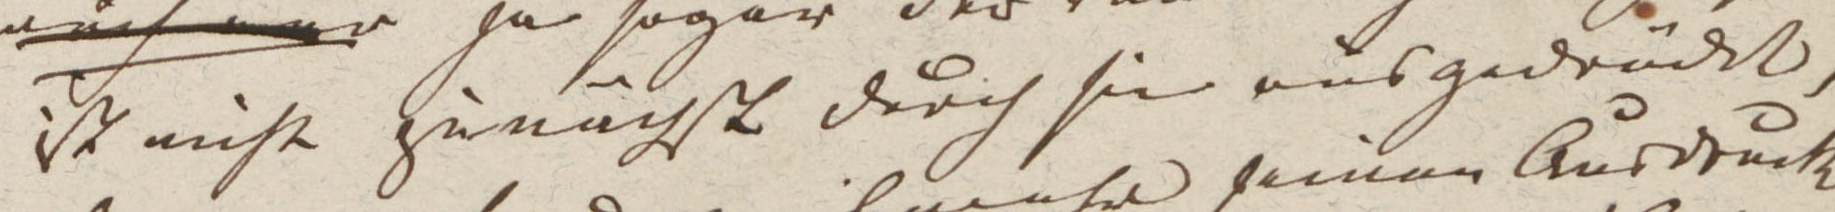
ist nicht zunächst durch sie ausgedrückt;
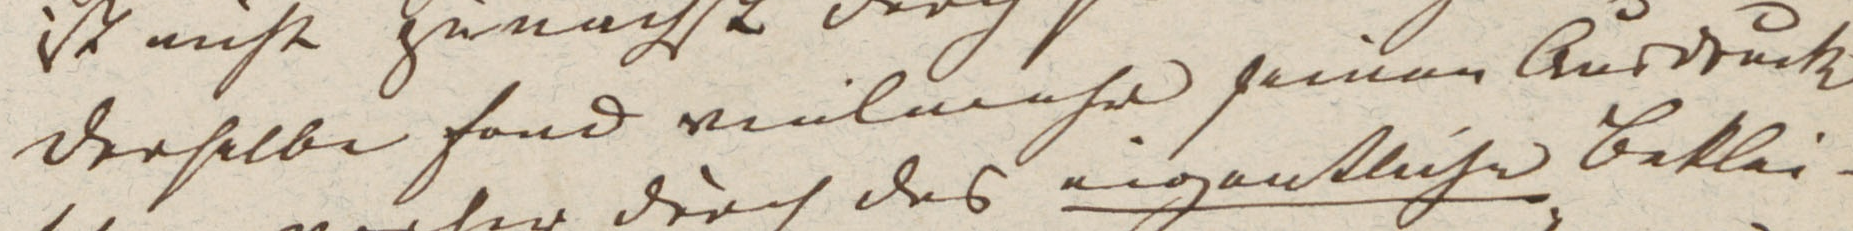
derselbe fand vielmehr seinen Ausdruck
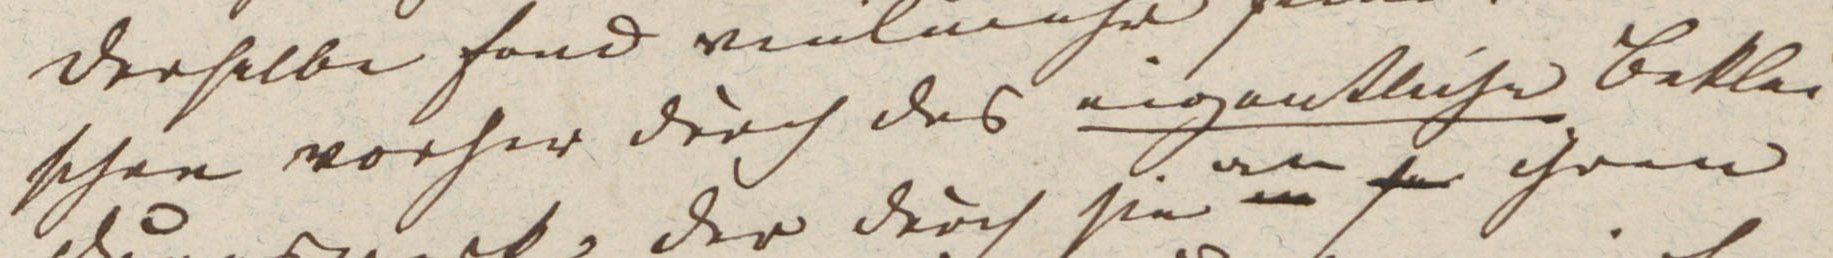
schon vorher durch das eigentliche Beklei-
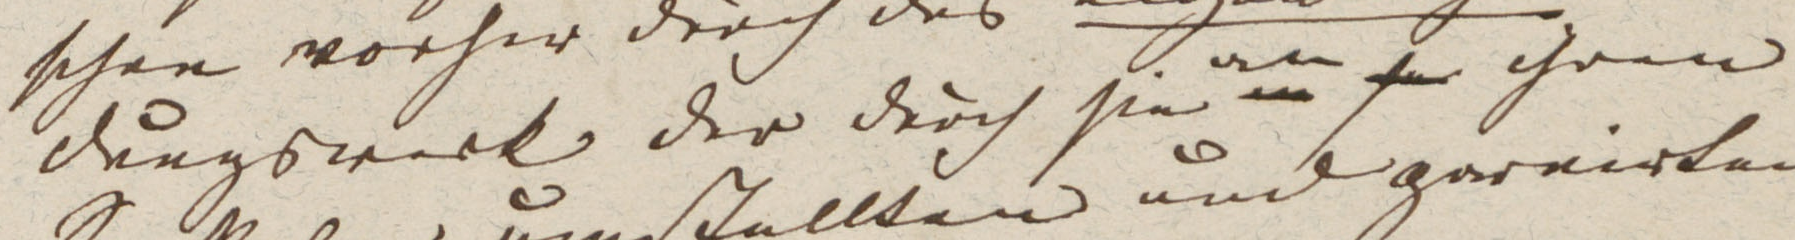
dungswerk der durch sie in an ihren
